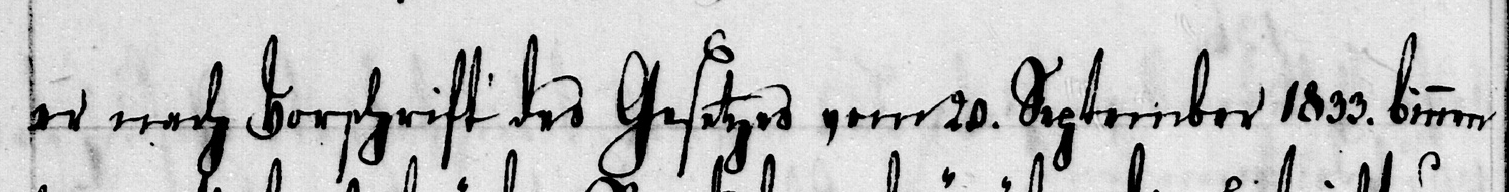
er nach Vorschrift des Gesetzes vom 20. September 1833. bin¬
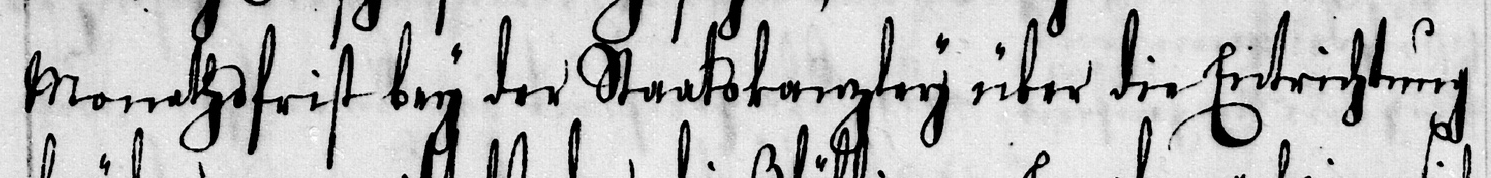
Monathsfrist bey der Staatskanzley über die Entrichtung
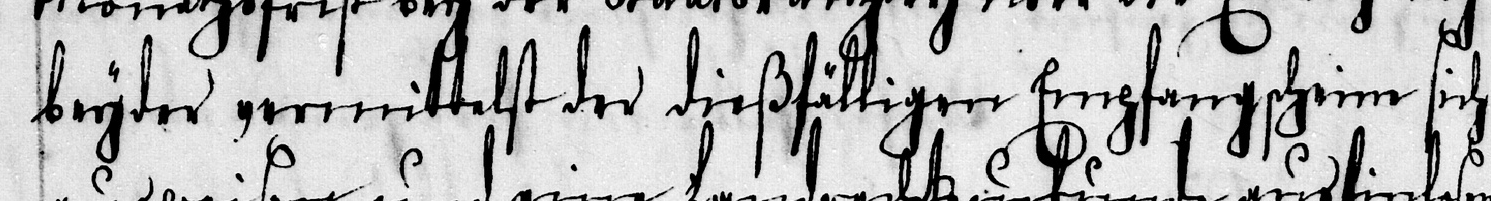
beyder vermittelst der dießfälligen Empfangscheine
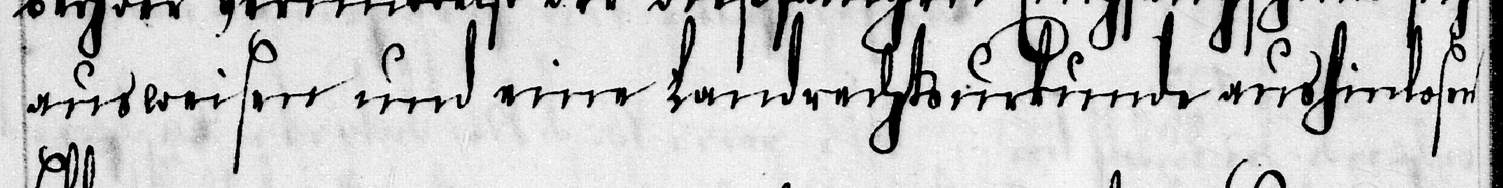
ausweisen und eine Landrechtsurkunde aushinlosen
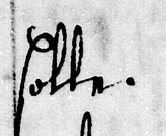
solle.
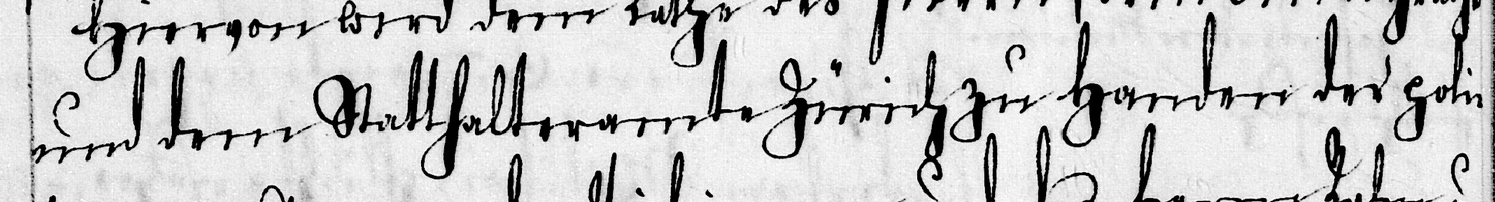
und dem Statthalteramte Zürich zu Handen der pol¬
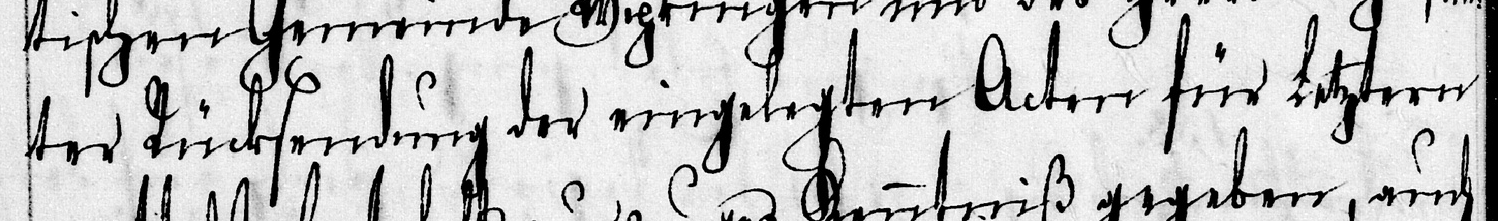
nter Rücksendung der eingelegten Acten für Letztern
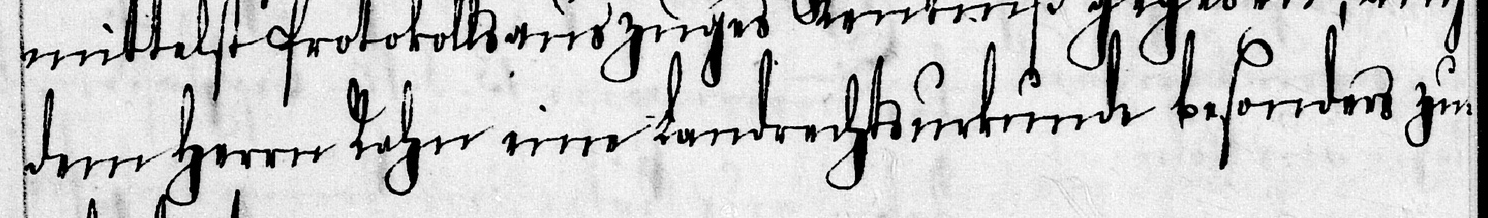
dem Herrn Rahn eine Landrechtsurkunde besonders zu¬
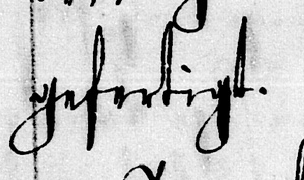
gefertigt.
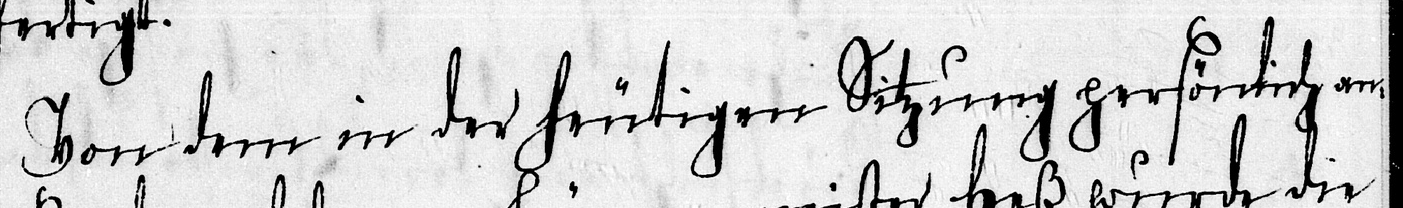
Von dem in der heutigen Sitzung persönlich an¬
